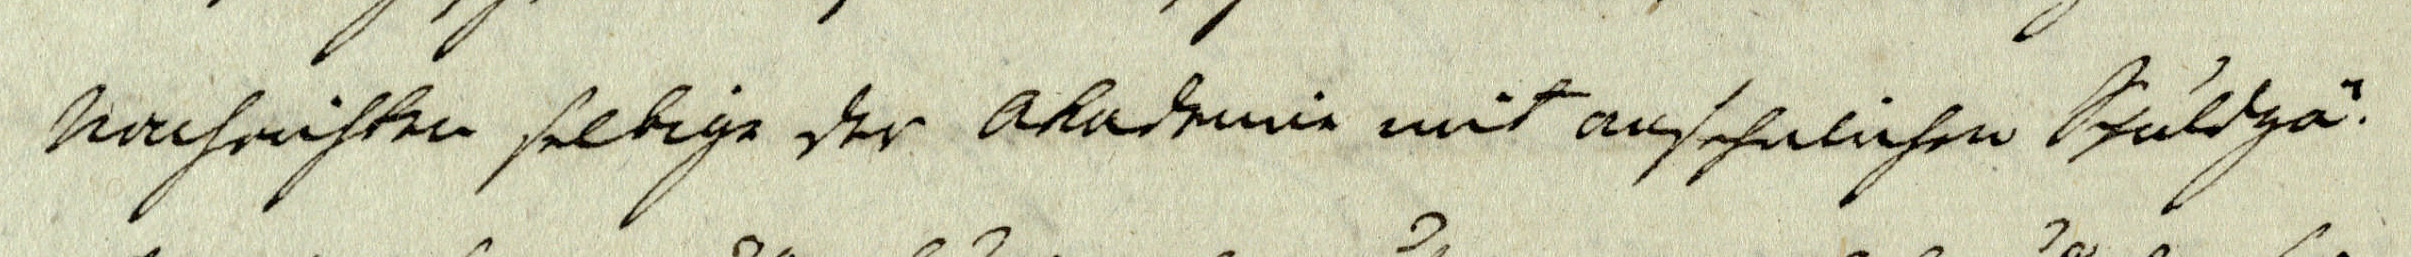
Nachrichten selbige der Akademie mit ansehnlichen Schuldpö¬
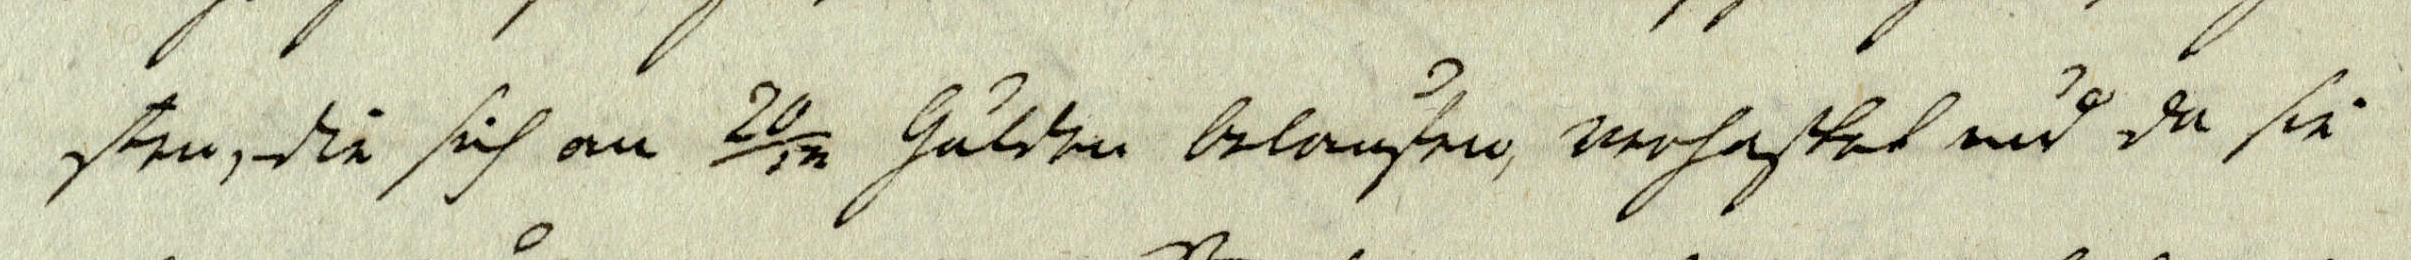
sten, die sich an 20/m Gulden belaufen verhaftet und da sie
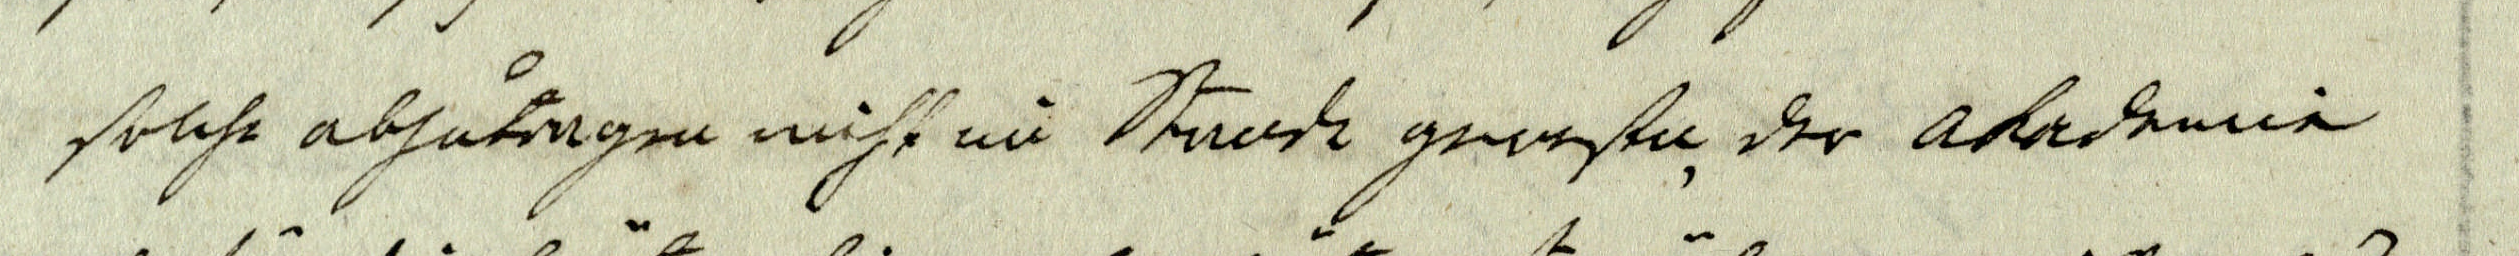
solche abzutragen nicht im Stande gewesen, der Akademie
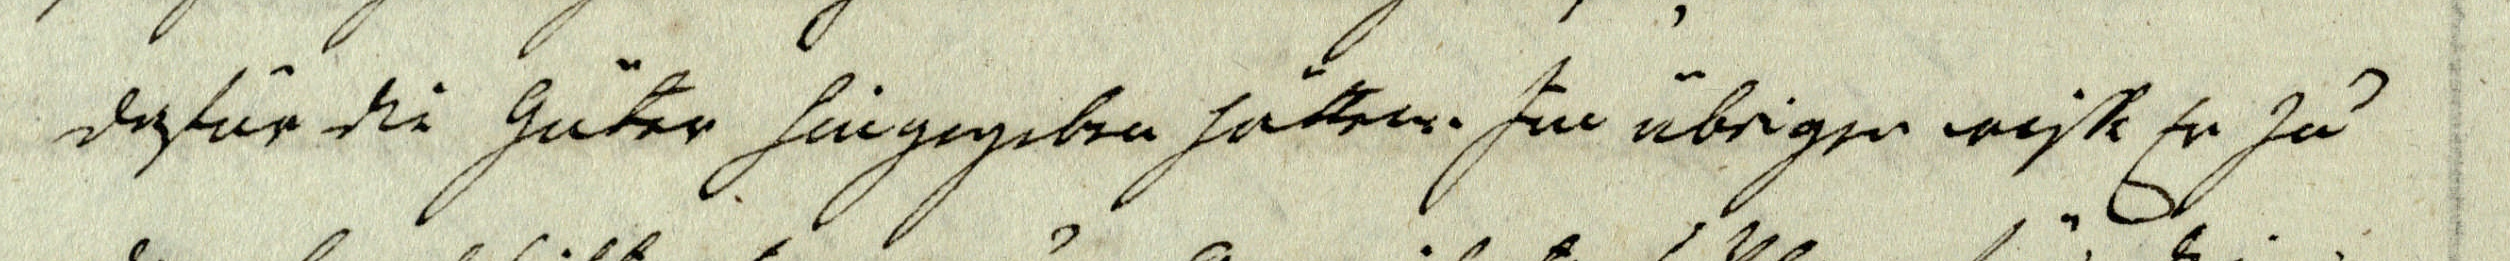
dafür die Güter hingegeben hätten Im übrigen wisse Er zu
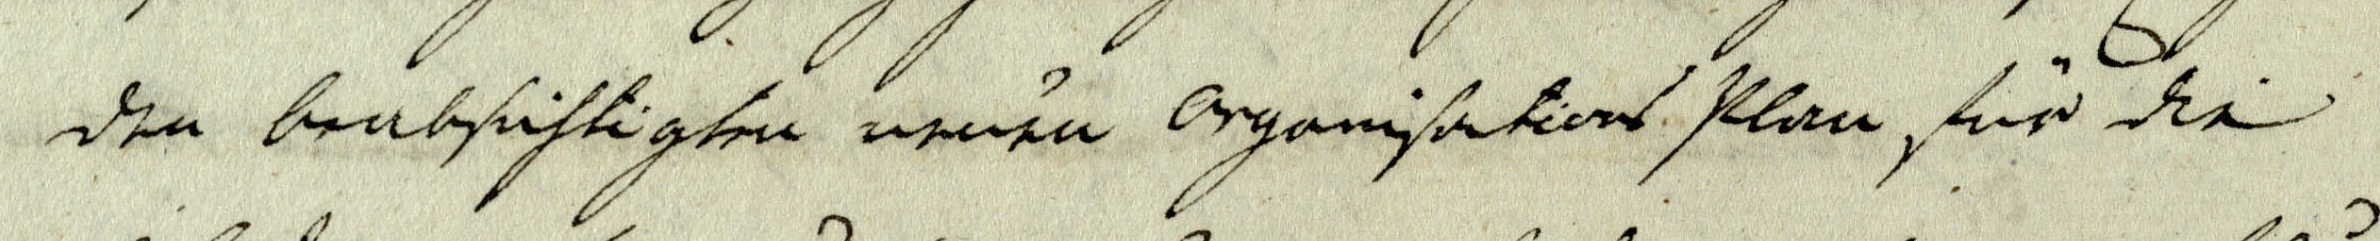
den beabsichtigten neuen Organisations Plan für die
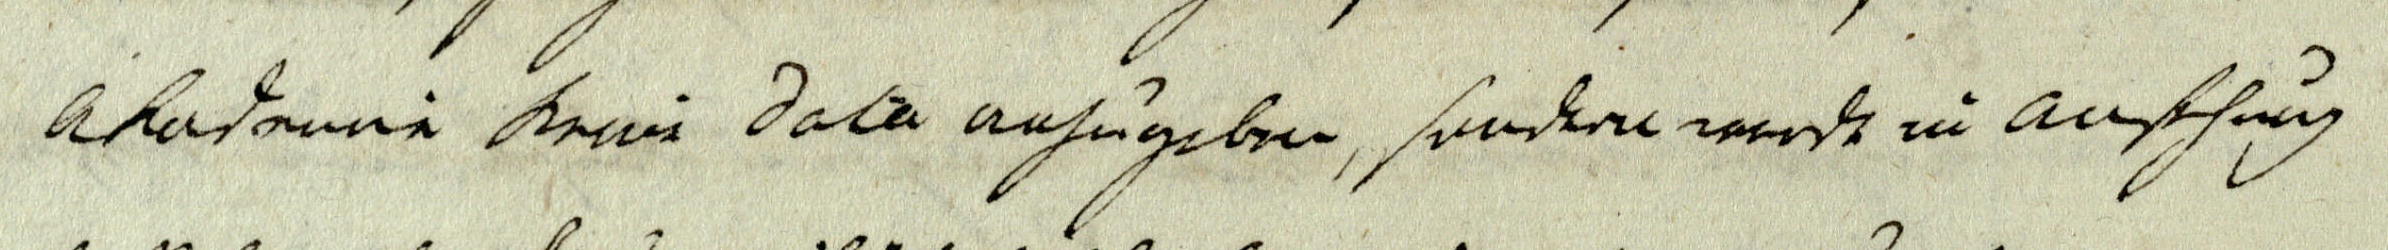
Akademie keine data anzugeben, sondern werde in Ansehung
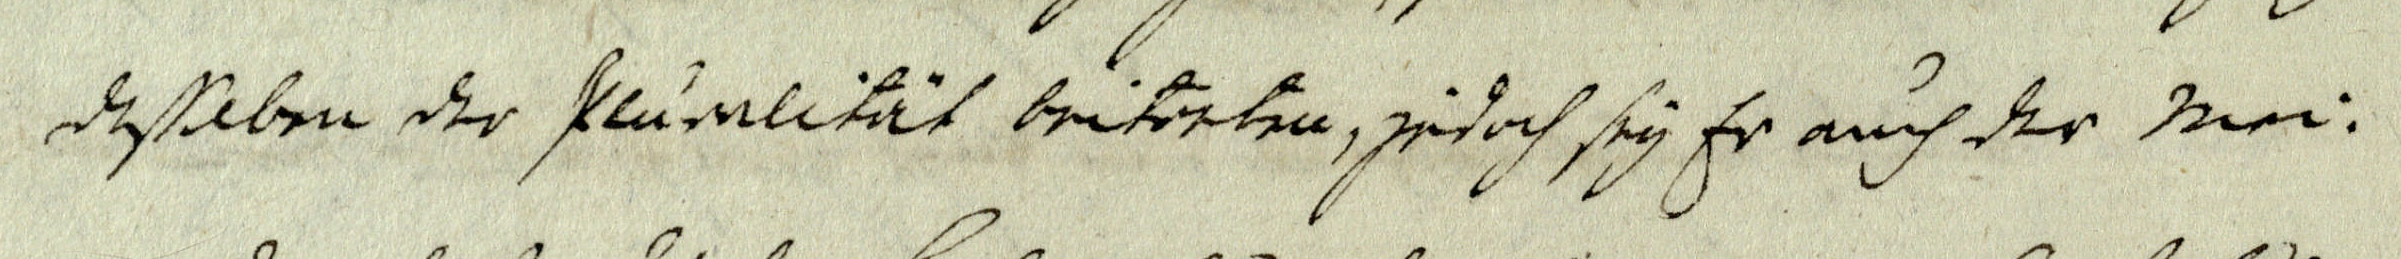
desselben der Pluralität beitreten, jedoch seÿ Er auch der Mei¬
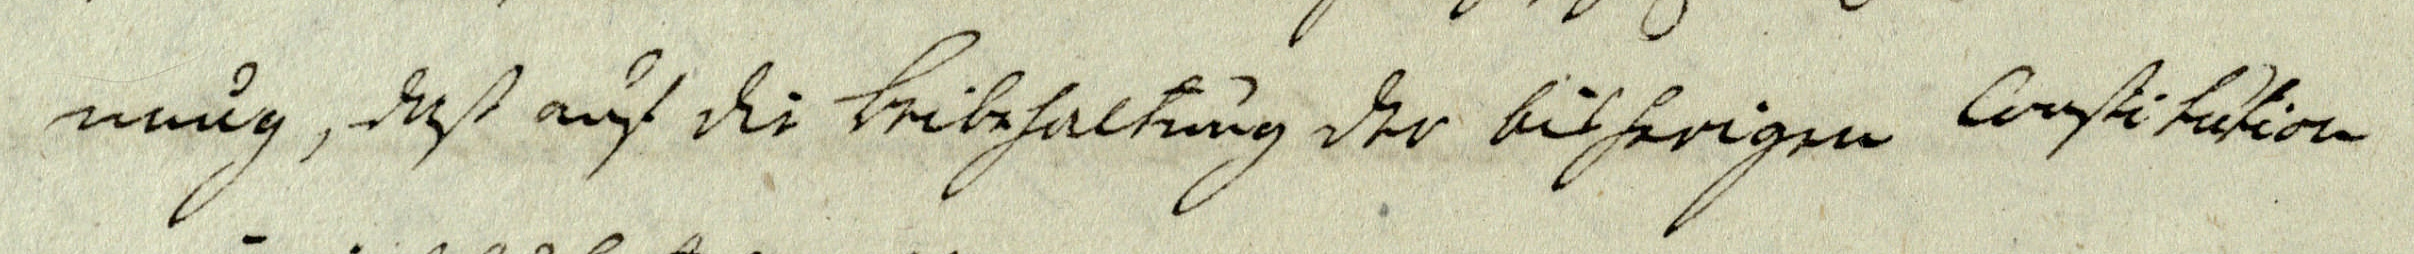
nung, daß auf die Beibehaltung der bisherigen Constitution
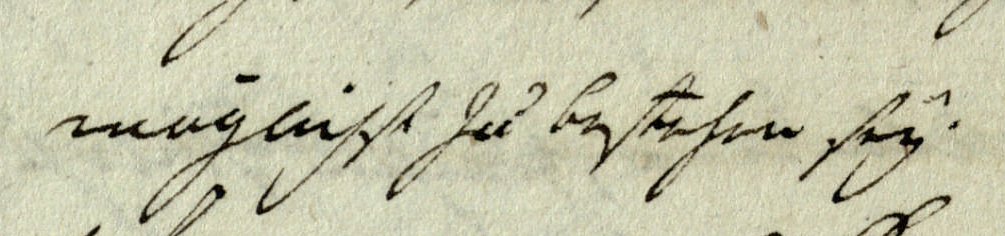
möglichst zu bestehen seÿ.
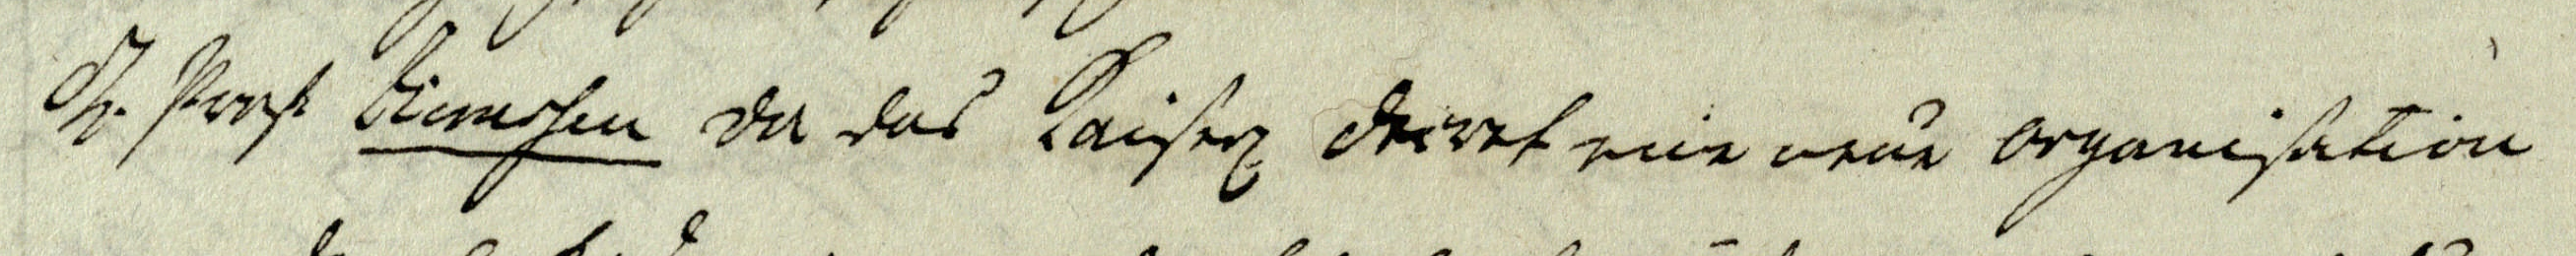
dh. Prof. Ziemssen da das Kaiser. Decret eine neue Organisation
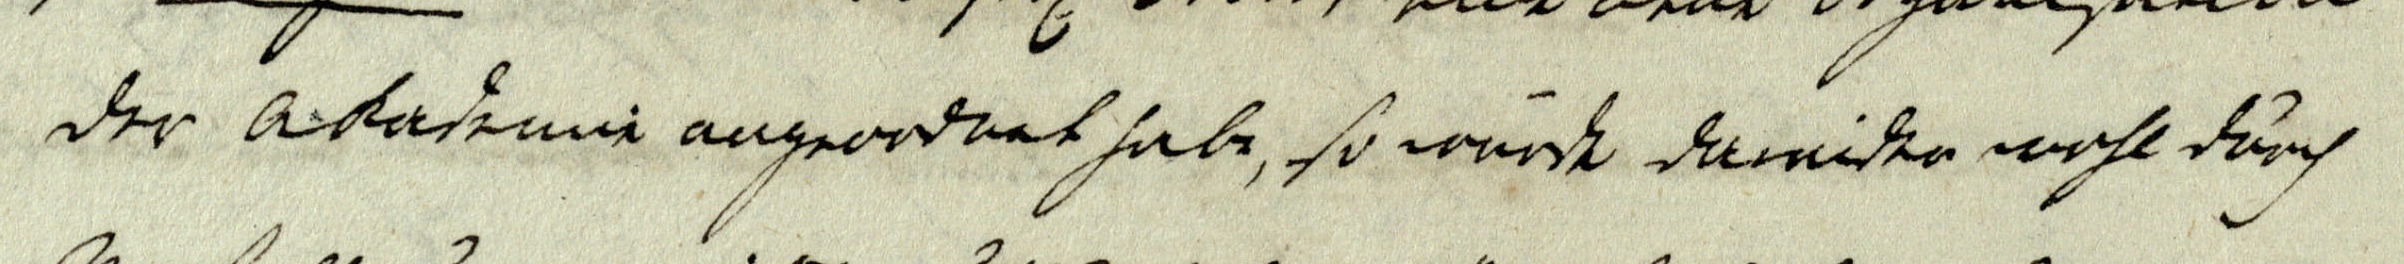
der Akademie angeordnet habe, so würde dawider wohl durch
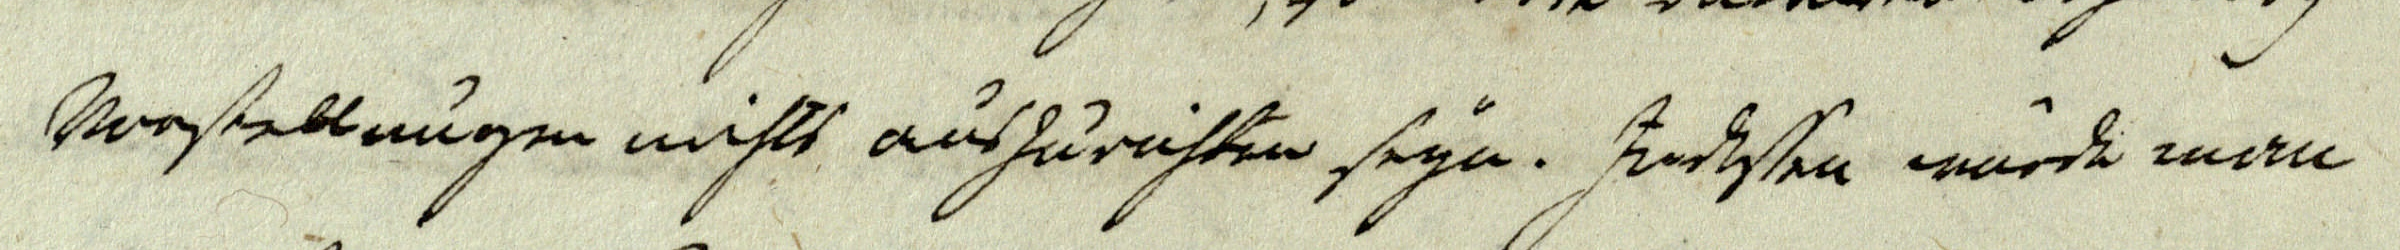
Vorstellungen nichts auszurichten seÿn. Indessen würde man
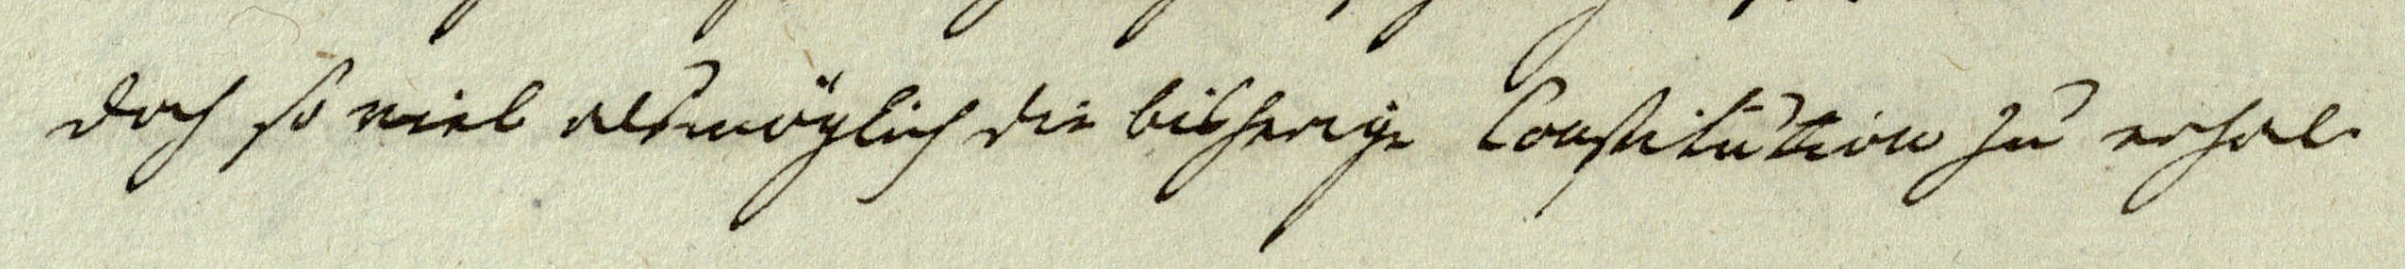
doch so viel alsmöglich die bisherige Constitution zu erhal¬
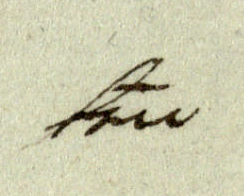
ten
